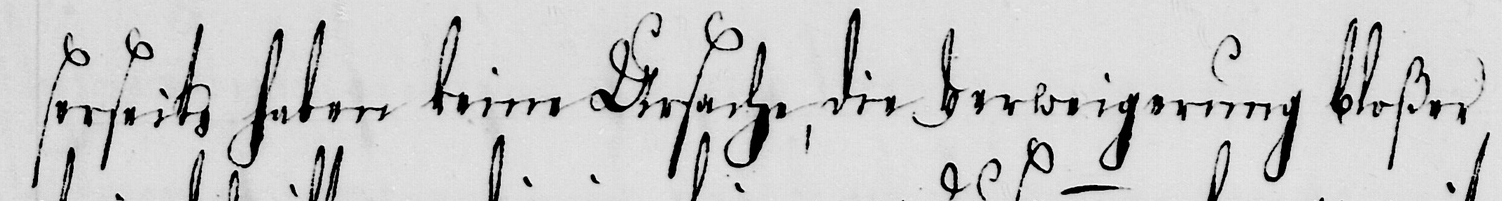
serseits haben keine Ursache, die Verweigerung bloßer
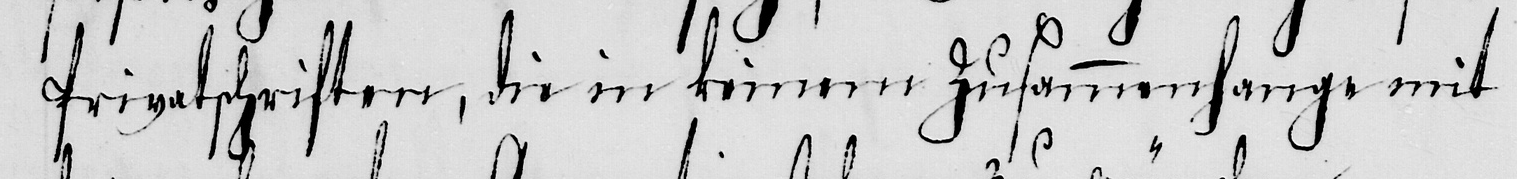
Privatschriften, die in keinem Zusammenhange mit
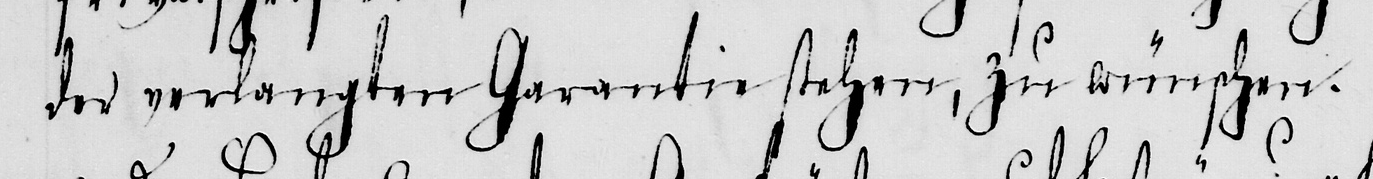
der verlangten Garantie stehen, zu wünschen.
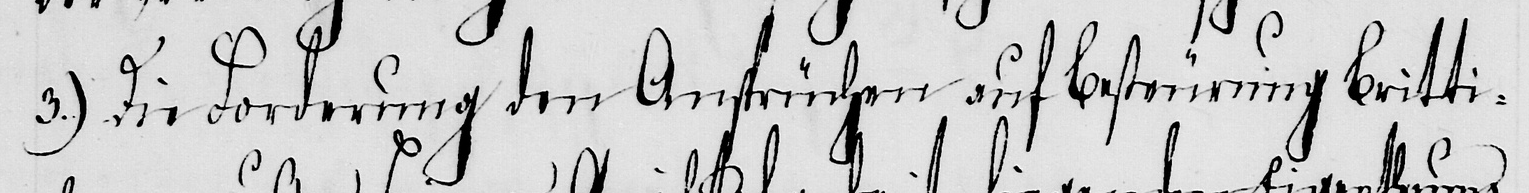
3.) Die Forderung den Ansprüchen auf Besteurung Britti¬
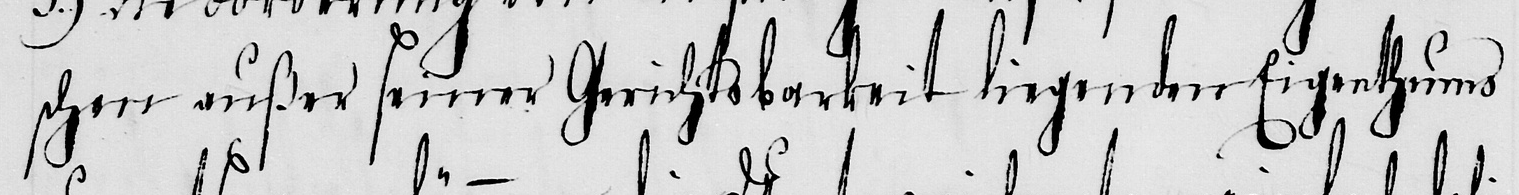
schen außer seiner Gerichtsbarkeit liegenden Eigenthums
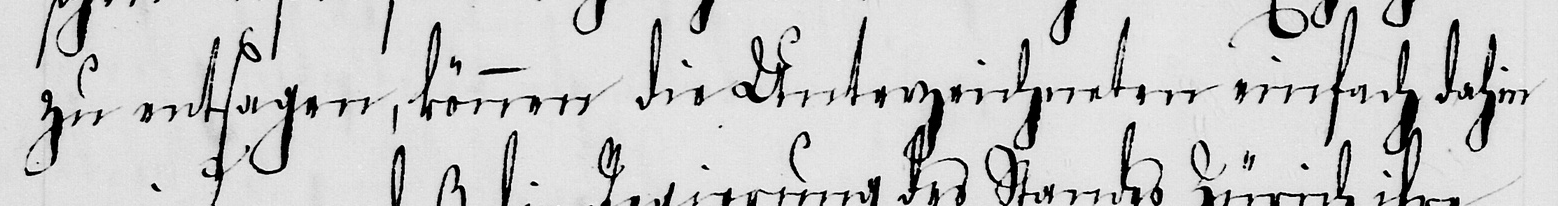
zu entsagen, können die Unterzeichneten einfach dahin
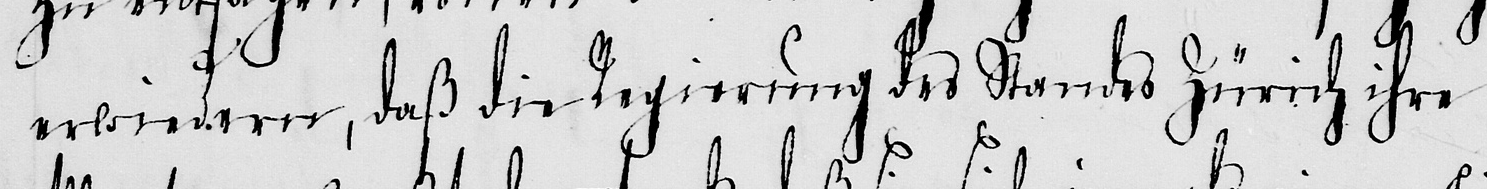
erwiedern, daß die Regierung des Standes Zürich ihre
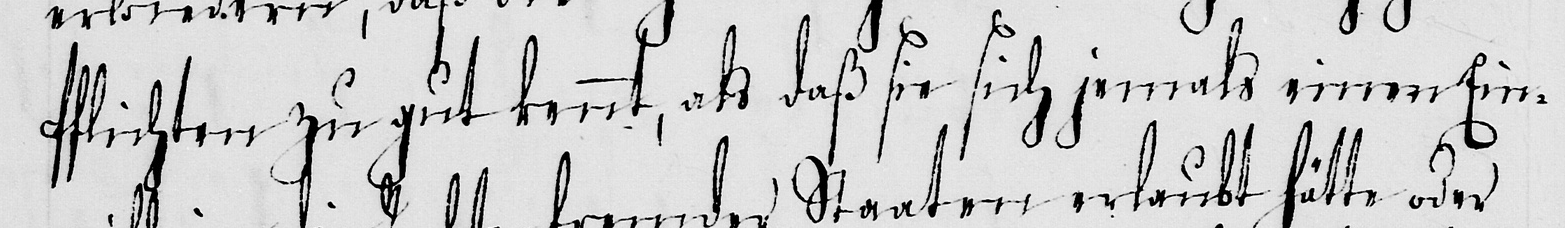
Pflichten zu gut kennt, als daß sie sich jemals einen Ein¬
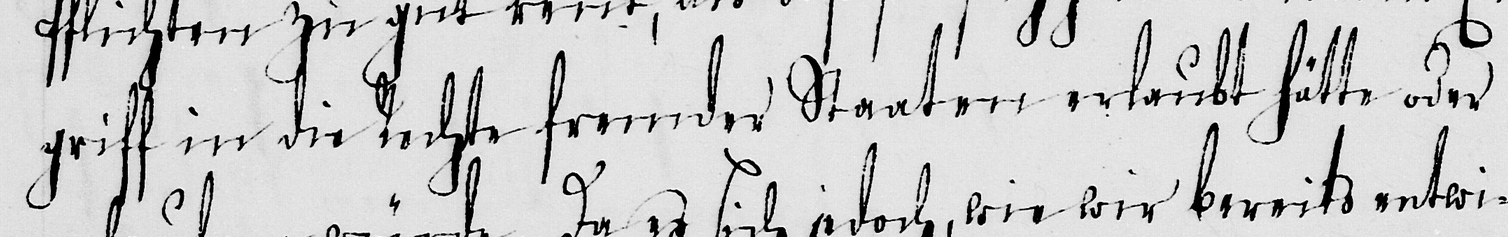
griff in die Rechte fremder Staaten erlaubt hätte oder
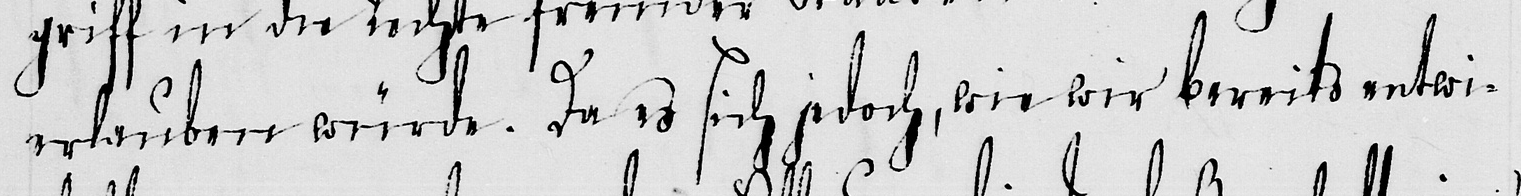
erlauben würde. Da es sich jedoch, wie wir bereits entwi¬
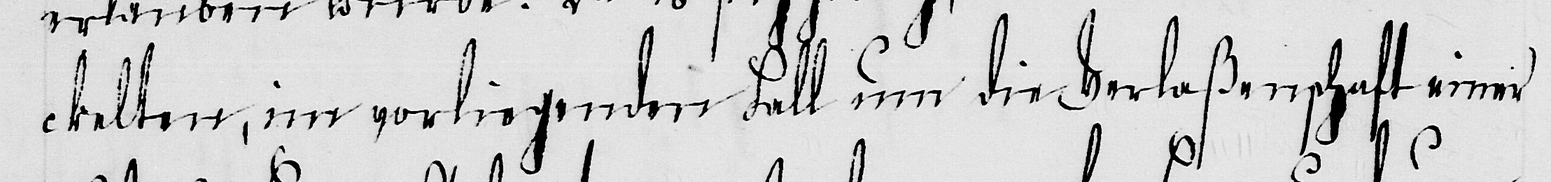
ckelten, im vorliegenden Fall um die Verlaßenschaft einer
